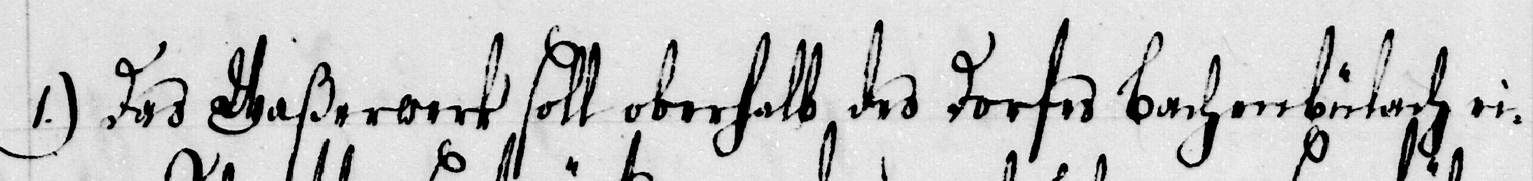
1.) Das Waßerwerk soll oberhalb des Dorfes Bachenbülach ei¬
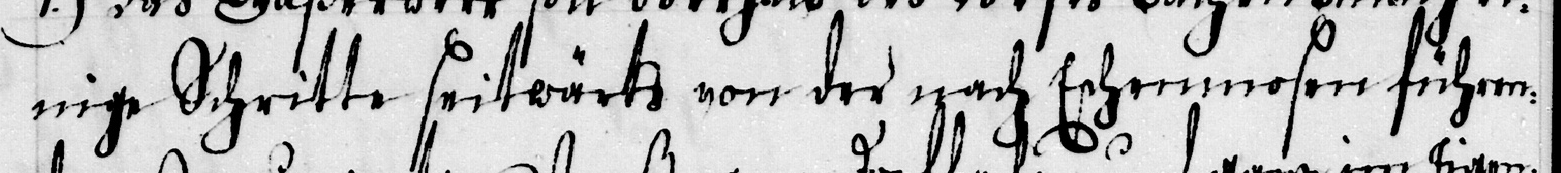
nige Schritte seitwärts von der nach Eschenmosen führen¬
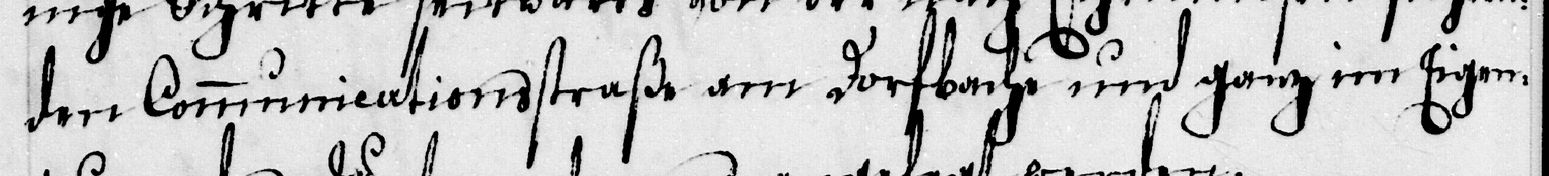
den Communicationsstraße am Dorfbache und ganz im Eigen¬
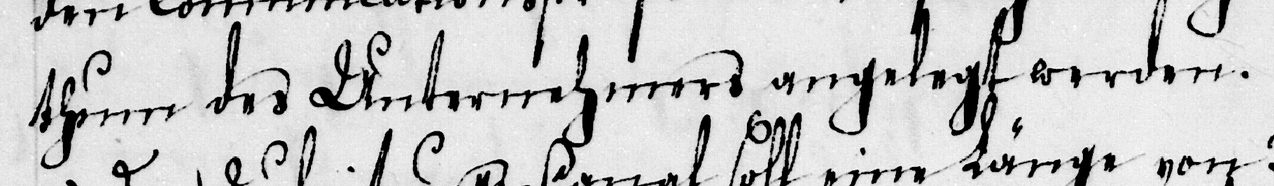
thum des Unternehmers angelegt werden.
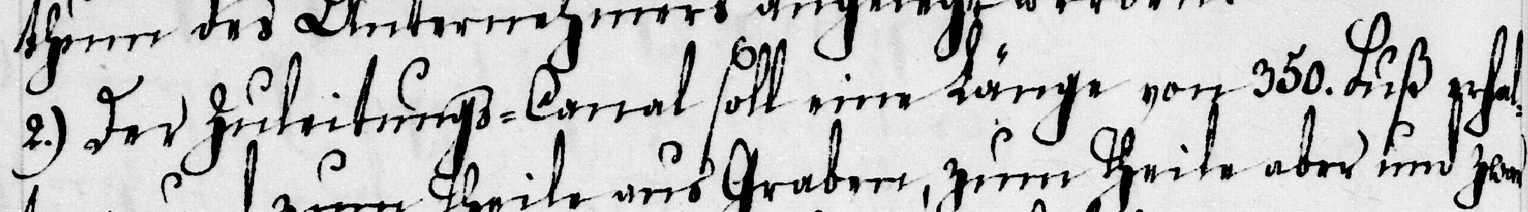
2.) Der Zuleitungs-Canal soll eine Länge von 350. Fuß erh¬
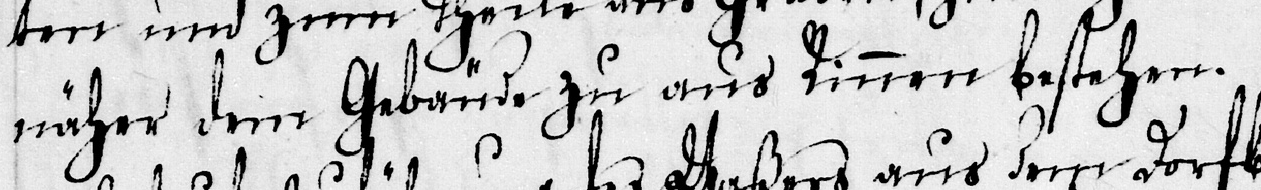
näher dem Gebäude zu aus Rinnen bestehen.
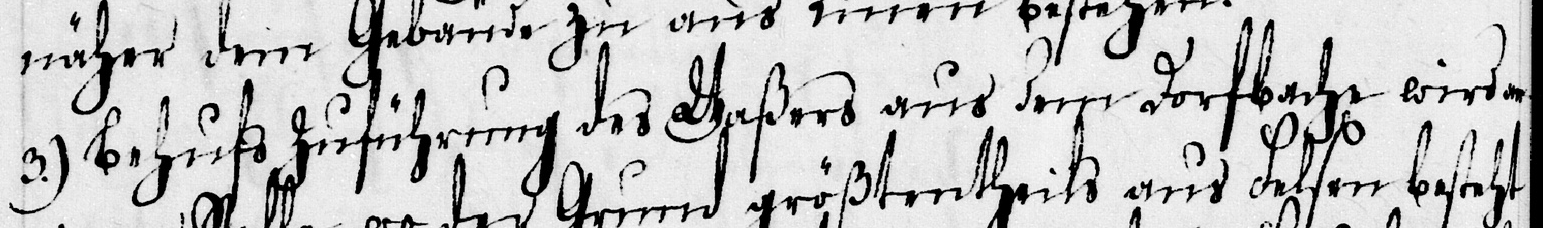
3.) Behufs Zuführung des Waßers aus dem Dorfbache wird
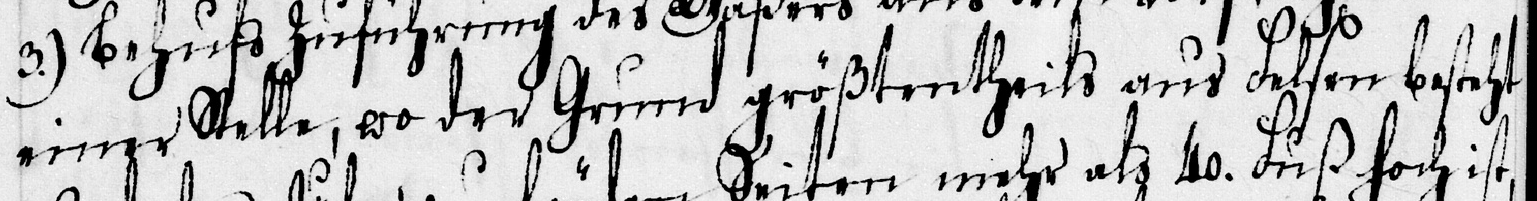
einer Stelle, wo der Grund größtentheils aus Felsen besteht
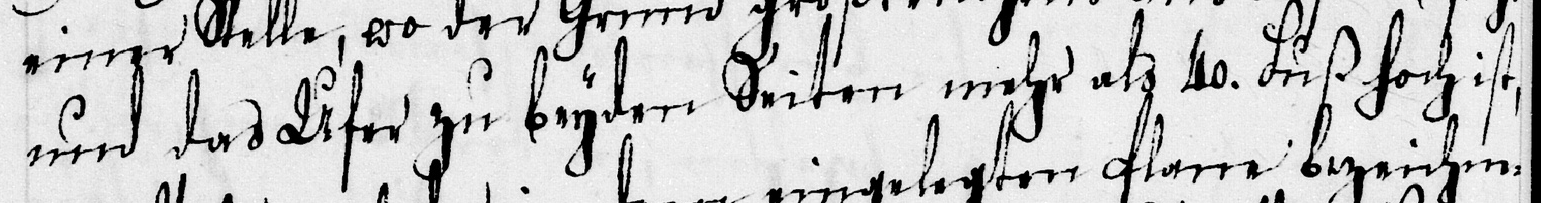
und das Ufer zu beyden Seiten mehr als 40. Fuß hoch i¬
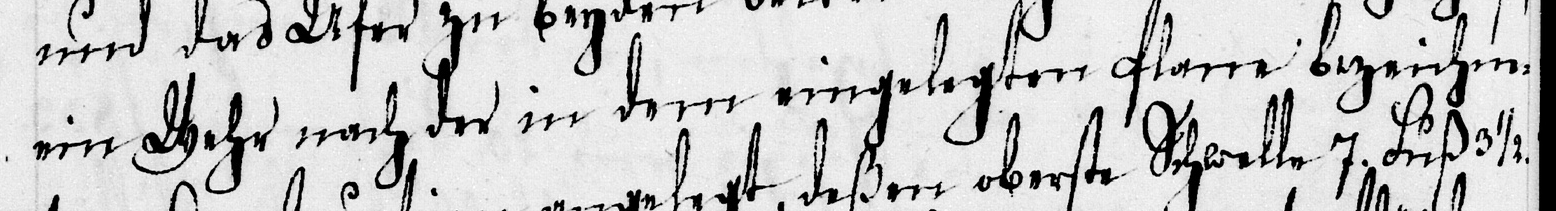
ein Wehr nach der in dem eingelegten Plane bezeichne¬
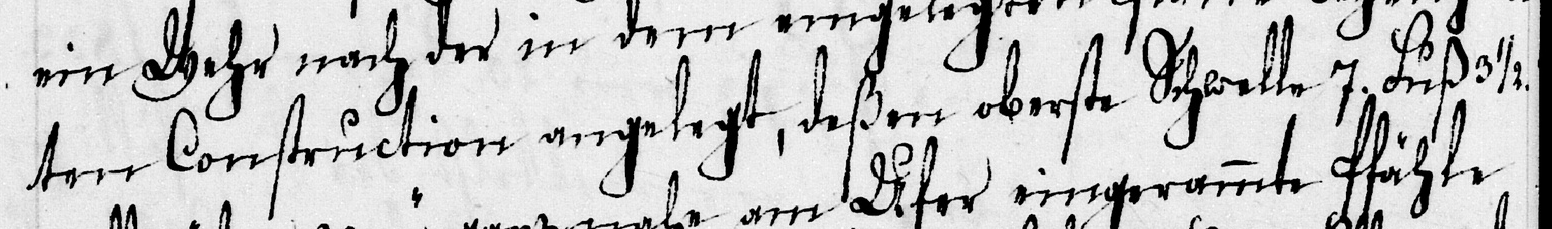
ten Construction angelegt, deßen oberste Schwelle 7. Fuß 3 ½.
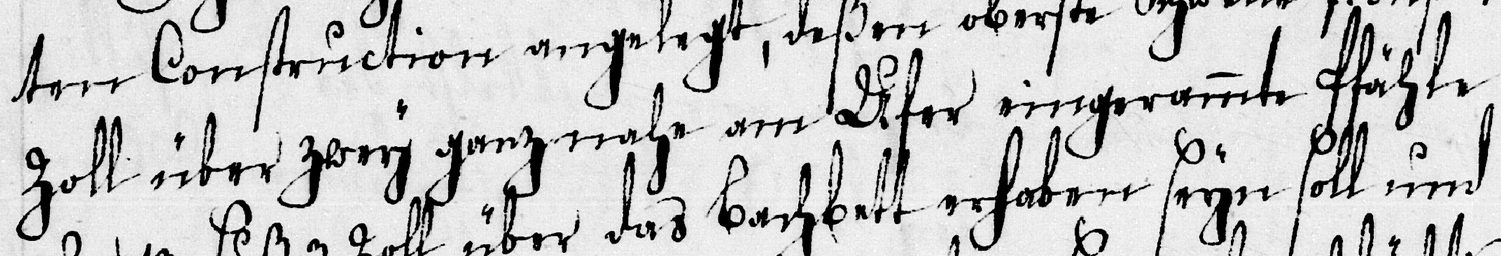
Zoll über zwey ganz nahe am Ufer eingerammte Pfähle
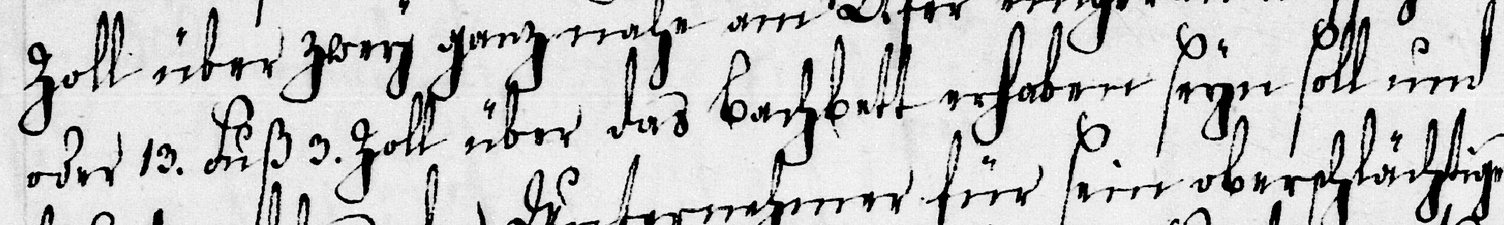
oder 13. Fuß 3. Zoll über das Bachbett erhoben seyn soll und
